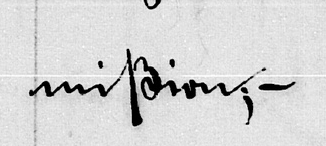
mißion; –
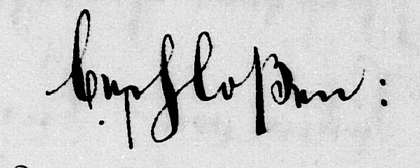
beschloßen:
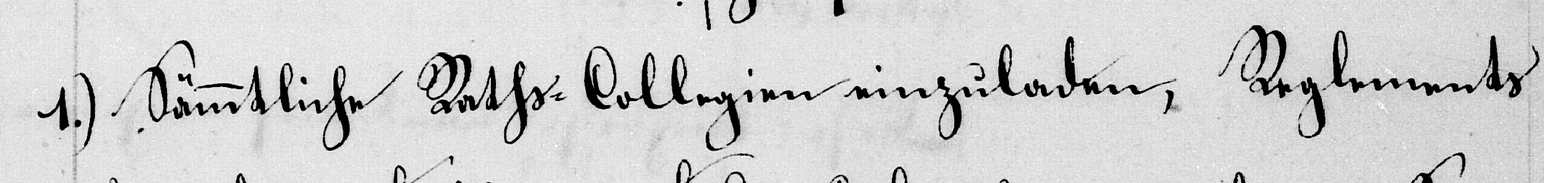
1.) Sämmtliche Raths-Collegien einzuladen, Reglements
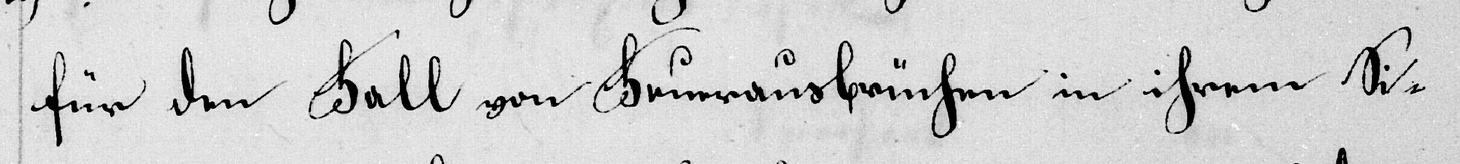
für den Fall von Feuerausbrüchen in ihrem Si¬
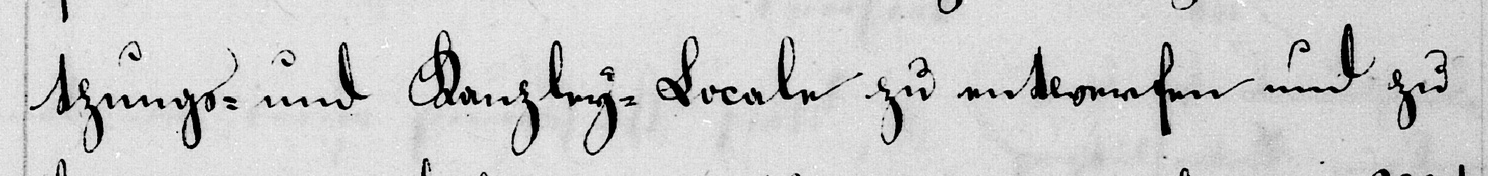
tzungs- und Kanzley-Locale zu entwerfen und zu
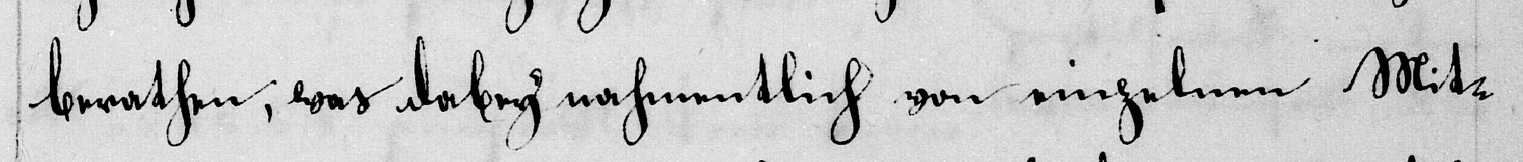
berathen, was dabey nahmentlich von einzelnen Mit¬
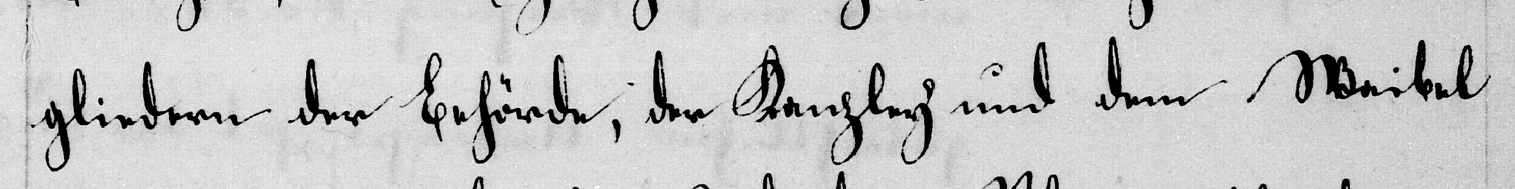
gliedern der Behörde, der Kanzley und dem Waibel
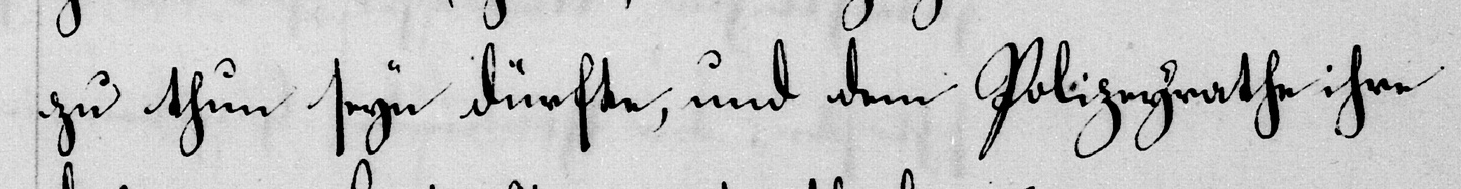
zu thun seyn dürfte, und dem Polizeyrathe ihre
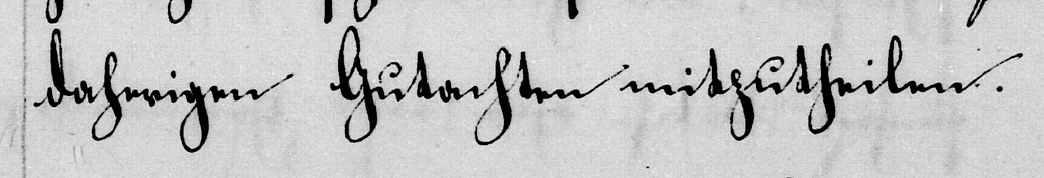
daherigen Gutachten mitzutheilen.
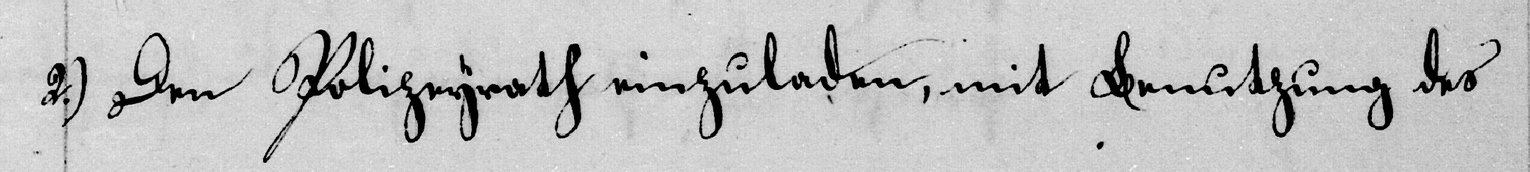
2.) Den Polizeyrathe einzuladen, mit Benutzung des
